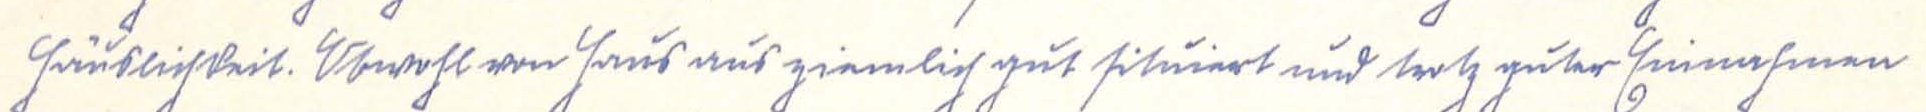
Häuslichkeit. Obwohl von Haus aus ziemlich gut situiert und trotz guter Einnahmen
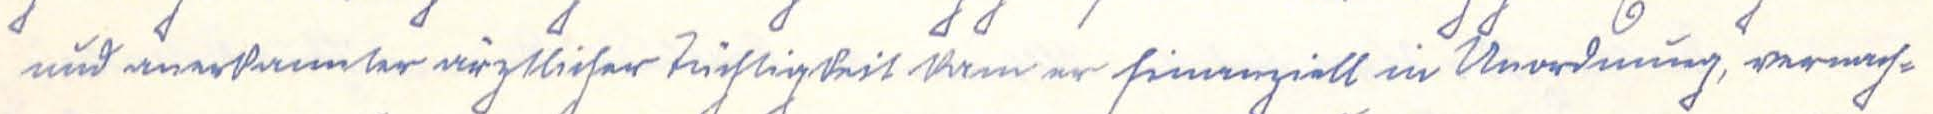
und anerkannter ärztlicher Tüchtigkeit kam er finanziell in Unordnung, vernach-
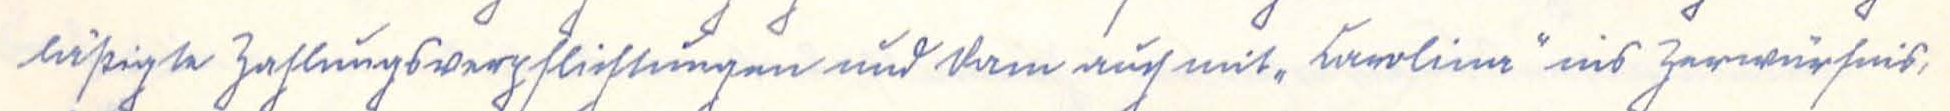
läßigte Zahlungsverpflichtungen und kam auch mit "Carolina" ins Zerwürfnis,
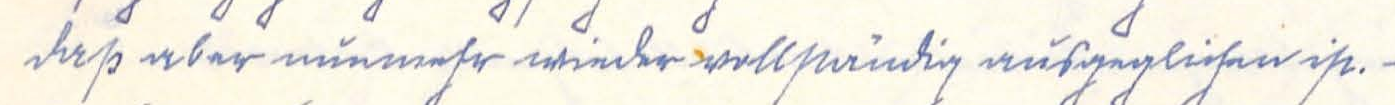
daß aber nunmehr wieder vollständig ausgeglichen ist.
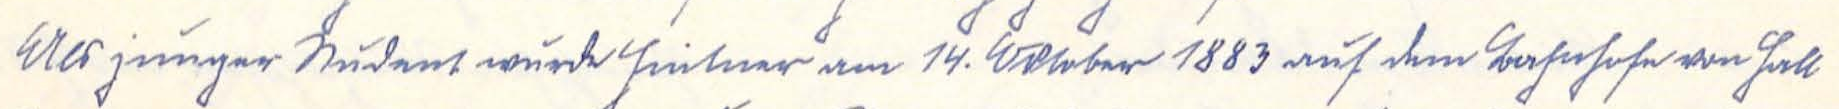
Als junger Student wurde Hintner am 14, Oktober 1883 auf dem Bahnhofe von Hall
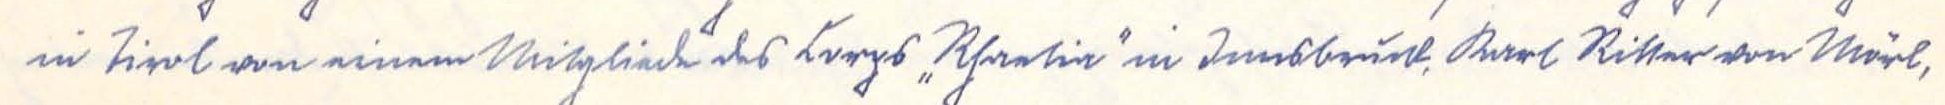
in Tirol von einem Mitglied des Corps "Rhaetia" in Innsbruck, Karl Ritter von Mörl,
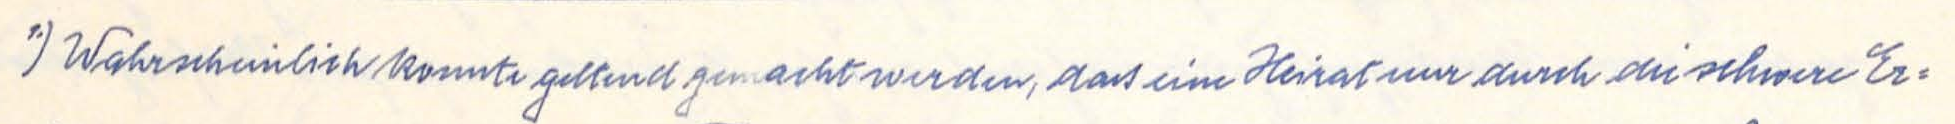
1.) Wahrscheinlich konnte geltend gemacht werden, daß eine Heirat nur durch die schwere Er-
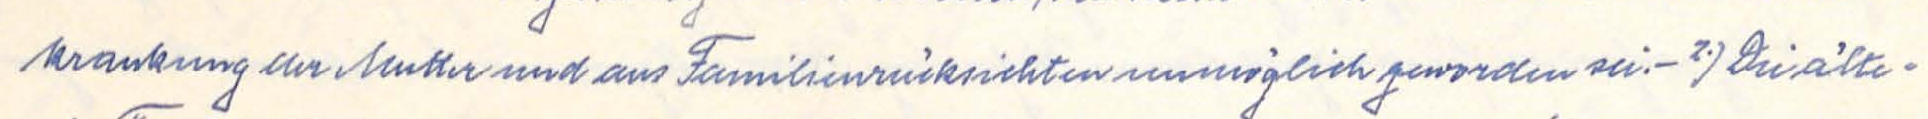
krankung der Mutter und aus Familienrücksichten unmöglich geworden sei,- 2.) Die älte-
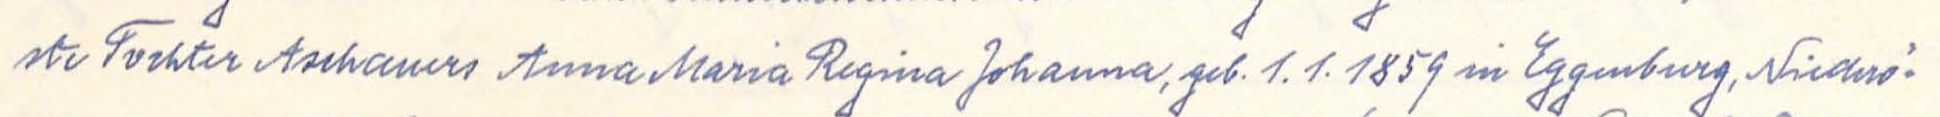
ste Tochter Aschauers Anna Maria Regina Johanna, geb. 1.1.1859 in Eggenberg, Niederö-
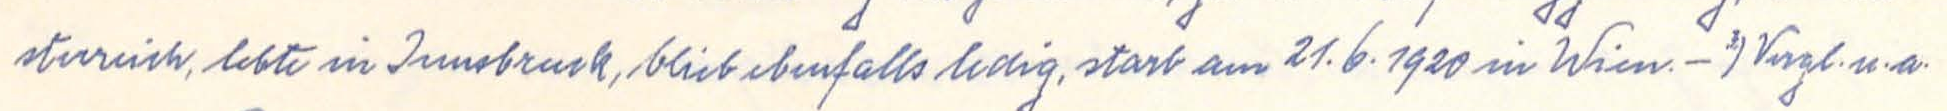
sterreich, lebte in Innsbruck, blieb ebenfalls ledig, starb am 21.6.1920 in Wien.- 3.) Vergl. u.a.
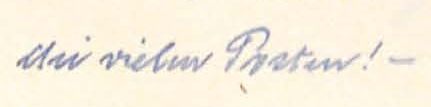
die vielen Posten!
